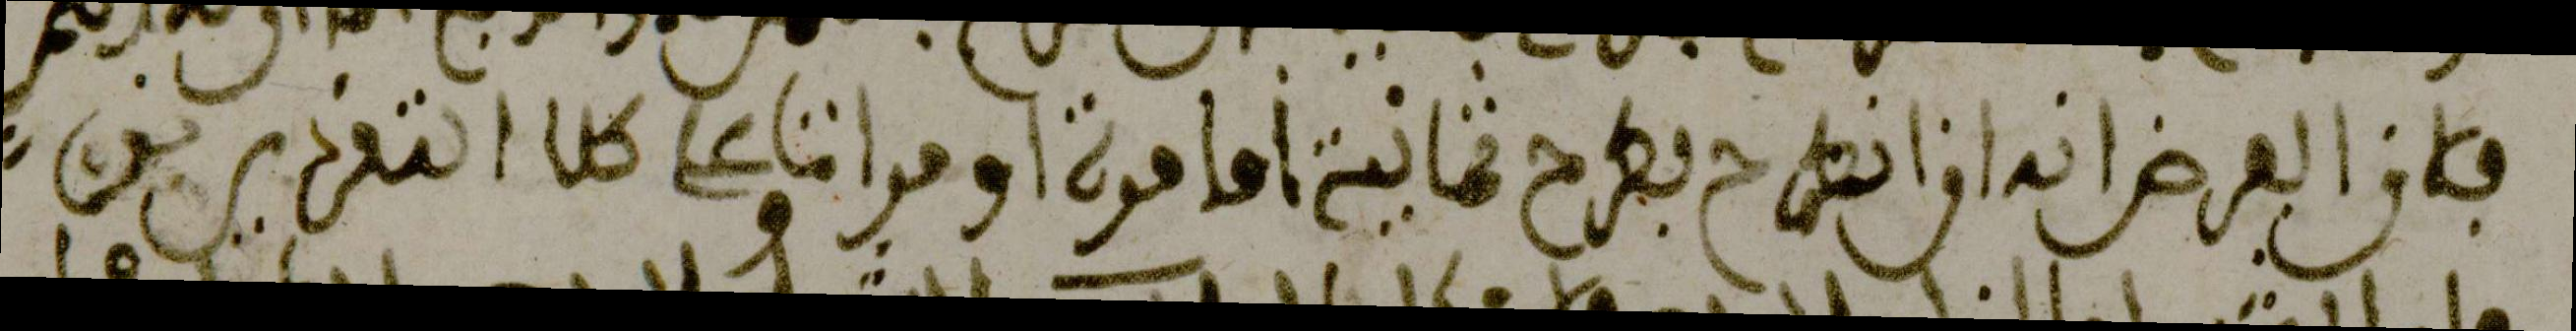فلان الفرض انه ان انطرح بطرح ثمانية اما مرة او مرات على كلا التقديرين
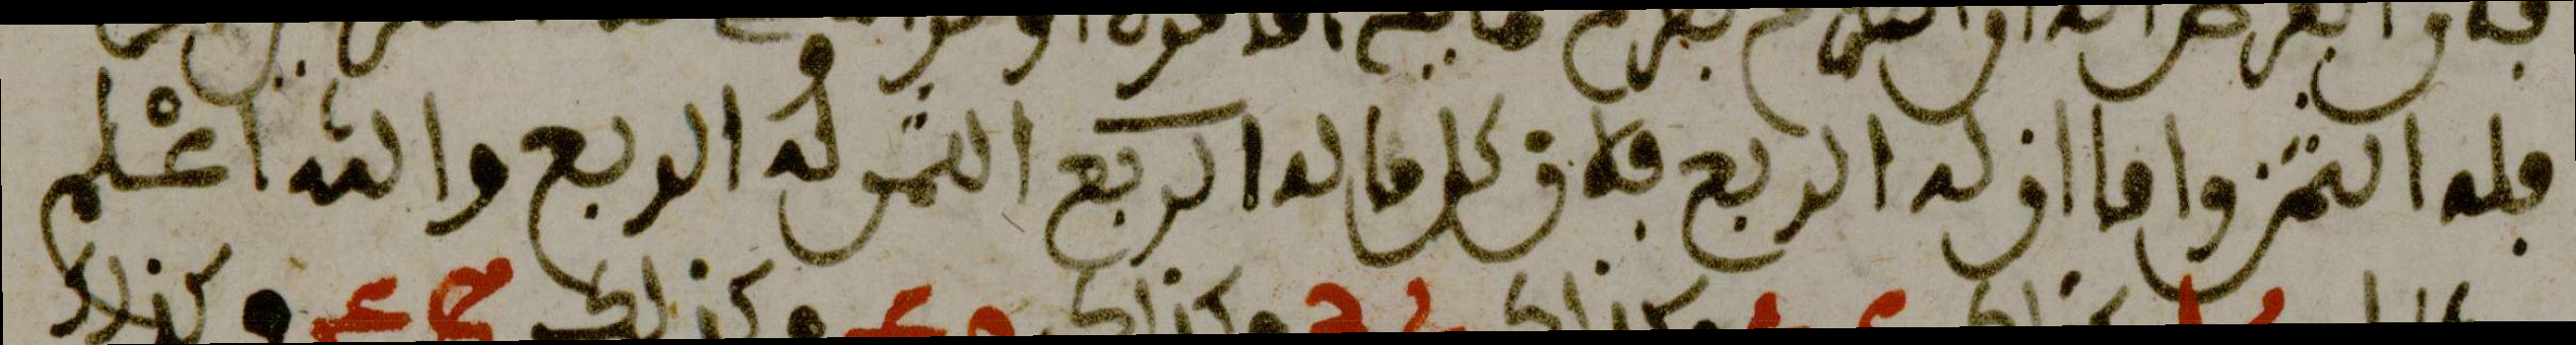فله الثمن واما ان له الربع فلان كل ما له الربع الثمن لهُ الربع والله اعْلم
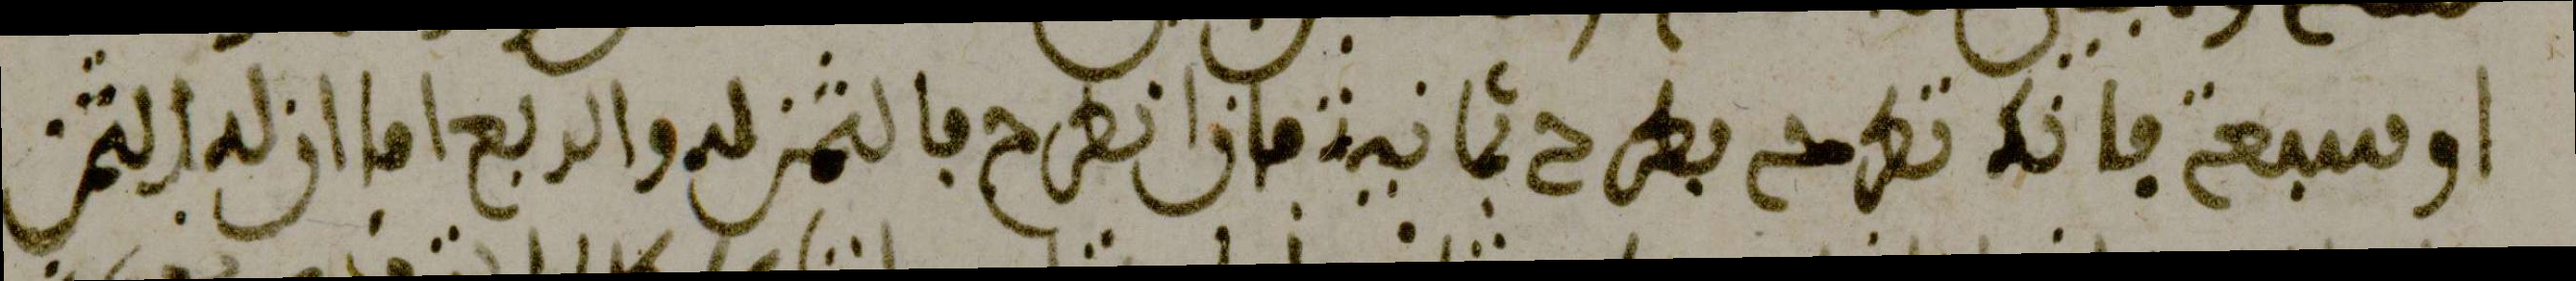او سبعة فانك تطرح بطرح ثمانية فان نطرح فالثمن له والربع اما ان له الثمن
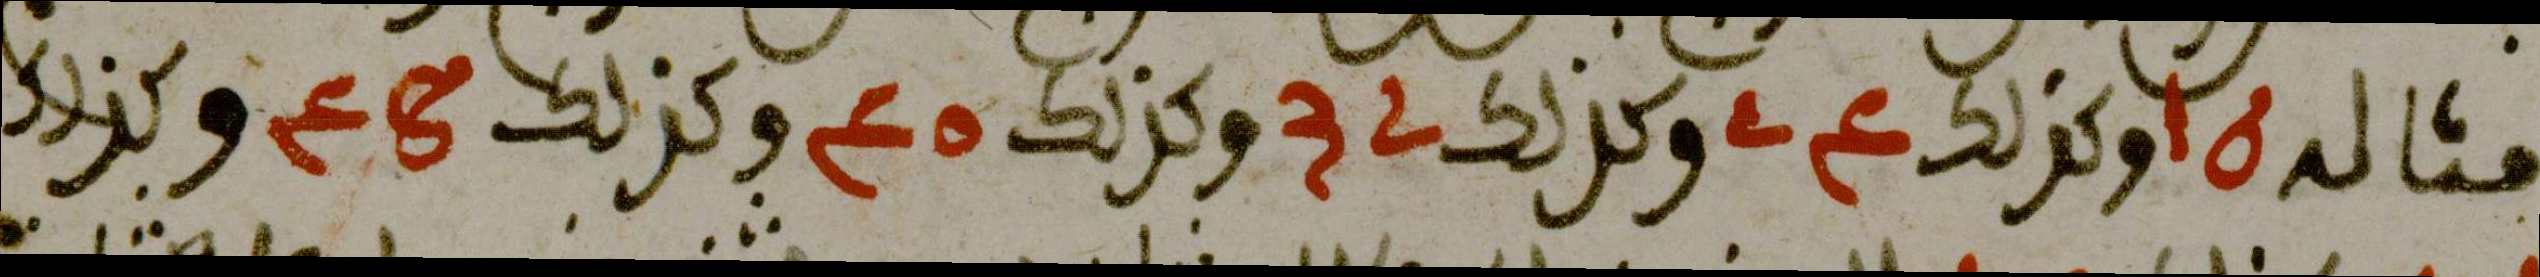مثاله 16 وكذلك 24 وكذلك 32 وكذلك 40 وكذلك 48 وكذلك
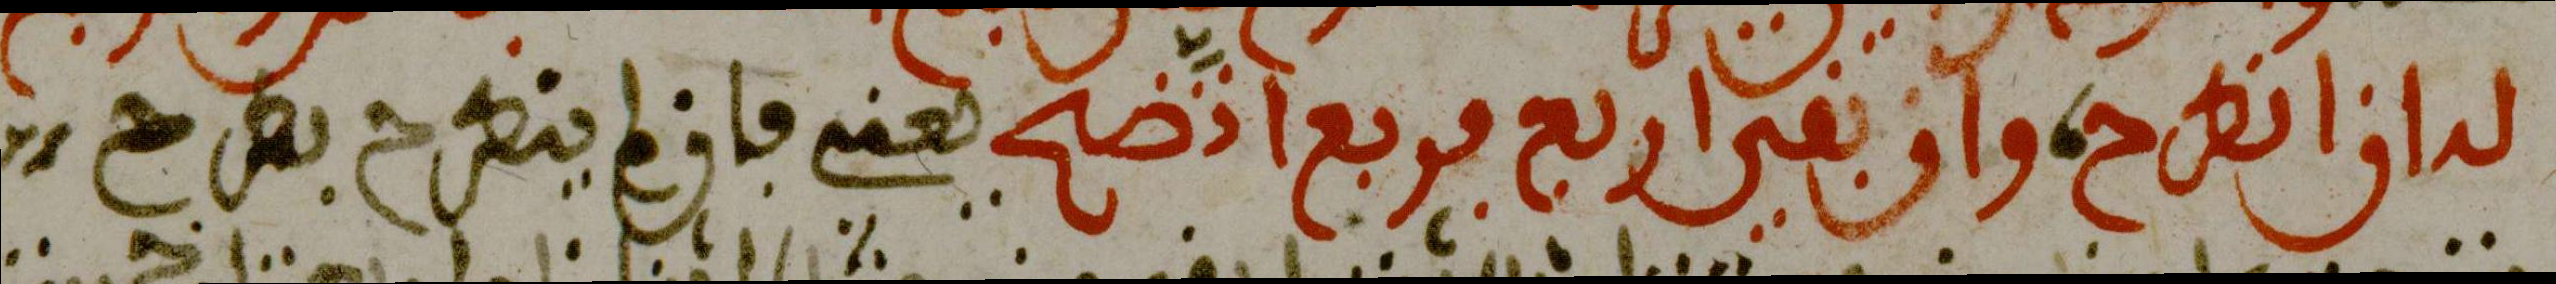له ان انطرح وان بقي اربع فربع اتّضح يعني فان لم ينطرح بطرح
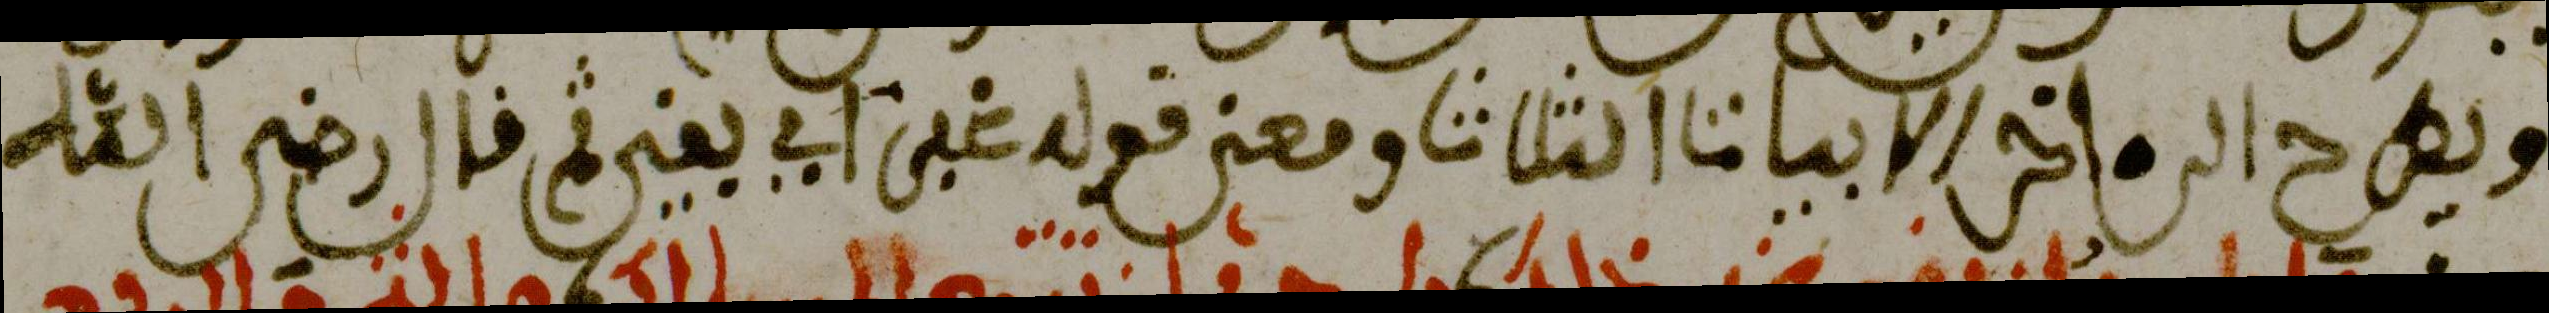ويطرح الى ءاخر الابيات الثلاث ومعنى قوله غبر اي بقي ثم قال رضى الله
